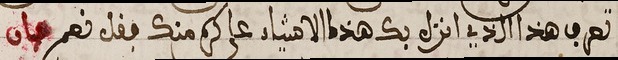تعرف هذا الذي انزل بك هذه الاشياء على كره منك فقل نعم فان
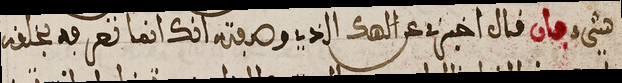شيء فان قال اخبرعن الهك الذي وصفته انك انما تعرفه بخلقه
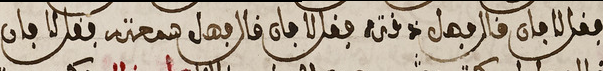فقل لا فان قال فهل ذقته فقل لا فان قال فهل سمعته فقل لا فان
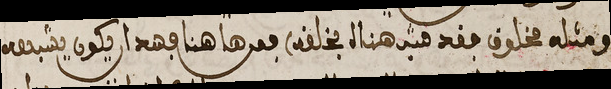ومثله مخلوق فقد شبهنا له بخلقه فمنها هنا فهذا ان يكون يشبهه
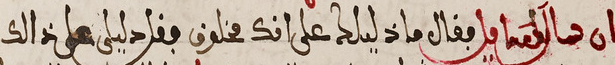ان سال سايل فقال ما دليلك على انك مخلوق فقل دليلى على ذالك
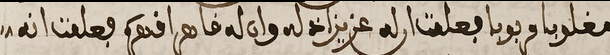مغلوبا مربوبا فعلت ان له عزيزا ذله وان له قاهرا قهره فعلت انه
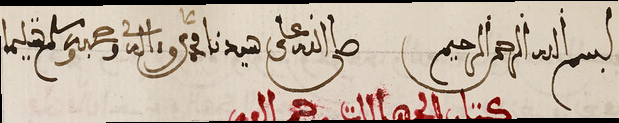بسم الله الرحمن الرحيم صلى الله على سيدنا محمد و ءاله وصحبه وسلم و تسليما
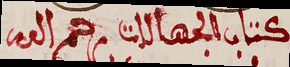كتاب الجهالات رحم الله
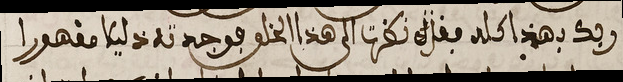ربك بهذا كله فقل نظرت الى هذا الخلق فوجدته دليلا مقهورا
